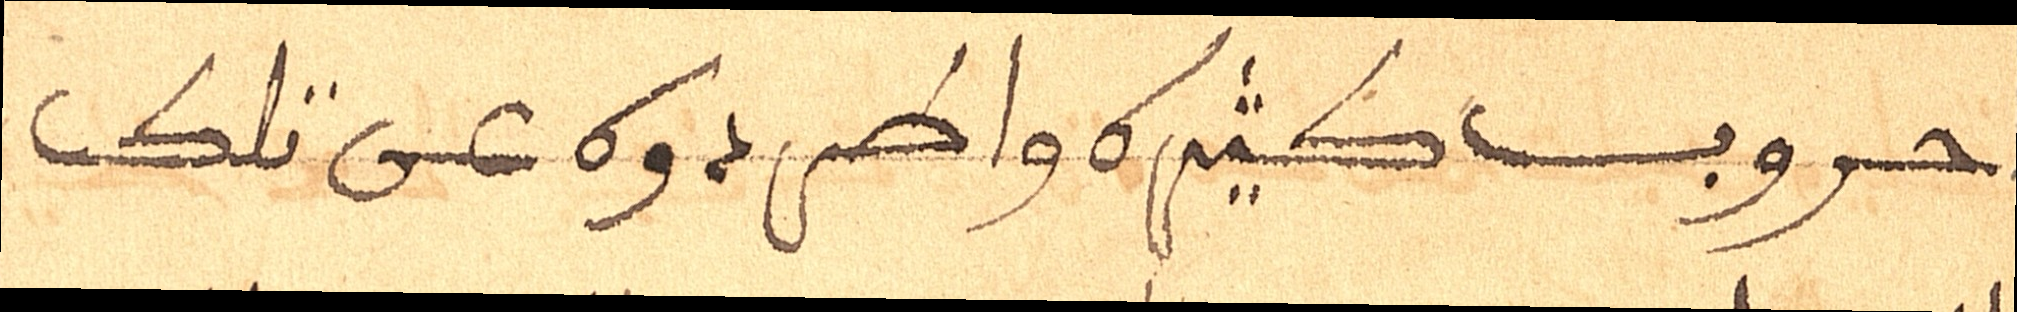حروب كثيره واطردوه عن تلك
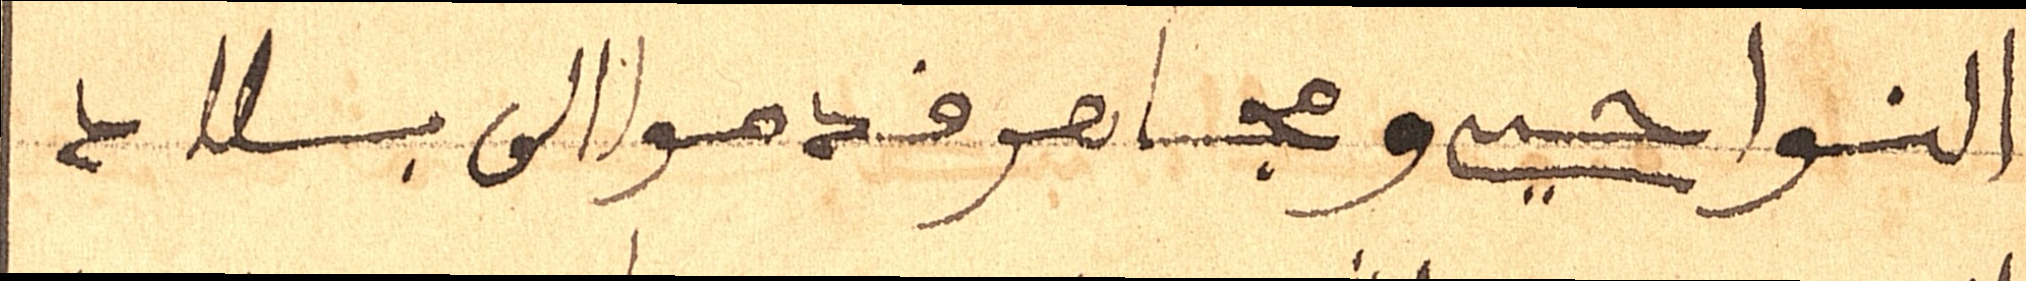النواحي ومجاهر قد موا الى بلاد
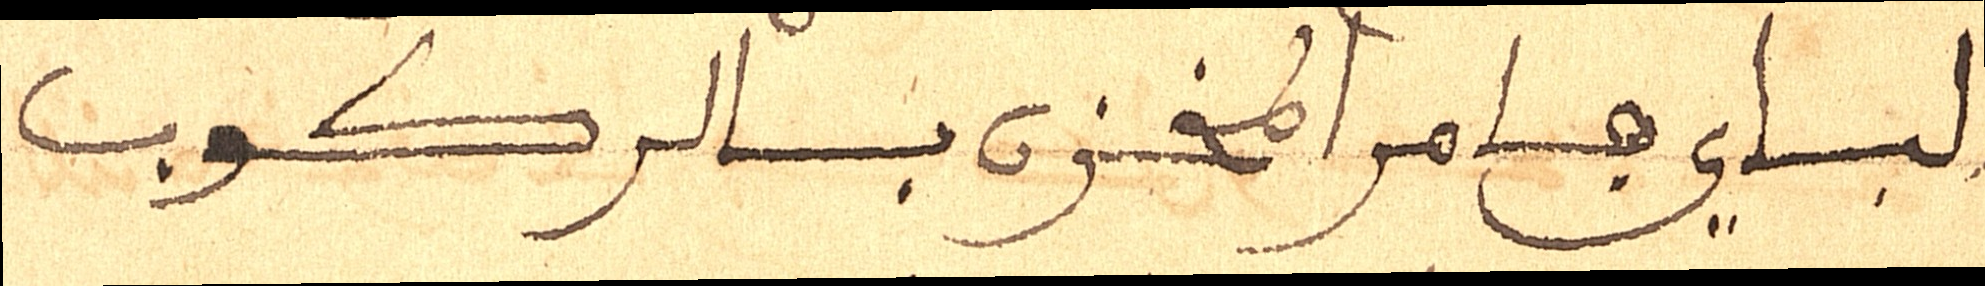الباي فامر المخزن بالركوب
